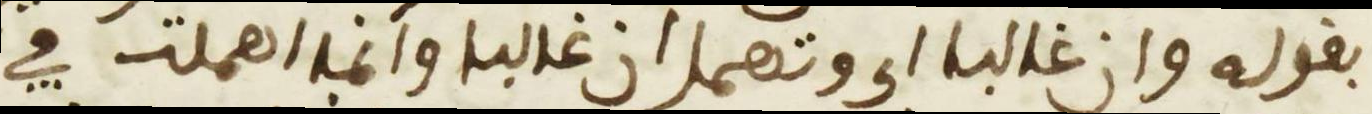بقوله و ان غالبا اي و تهمل ان غالبا و انما اهملت في
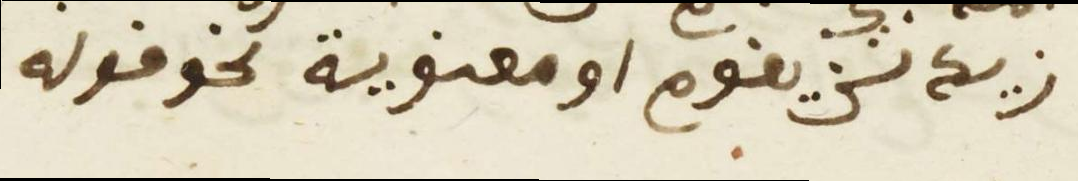زيد لن يقوم او معنوية نحو قوله
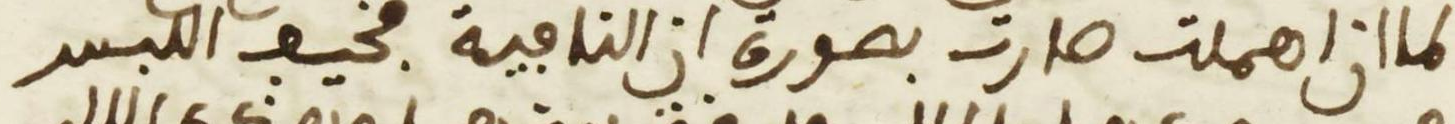لما ان اهملت صارت بصورة ان النافية فخيف اللبس
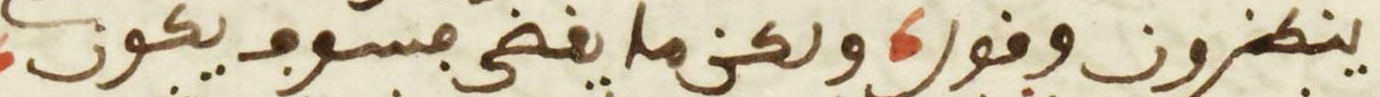ينظرون و قول و لكن ما يقضي فسوف يكون
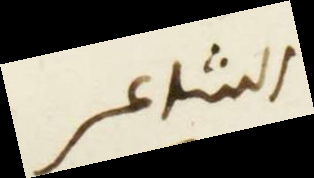الشاعر
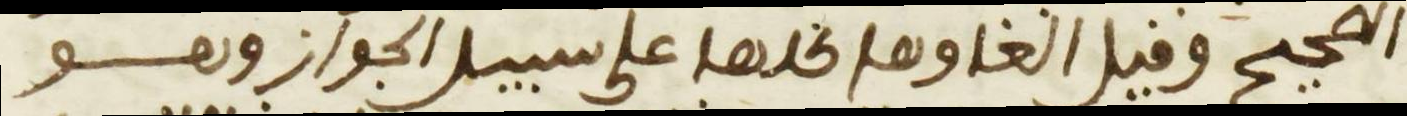الصحيح و قيل الغاوها كلها على سبيل الجواز و هو
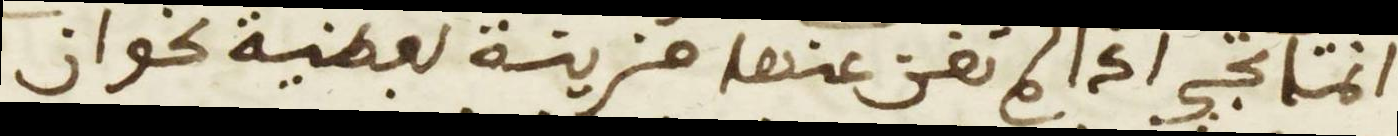انما تجي اذا لم تغن عنها قرينة لفظية نحو ان
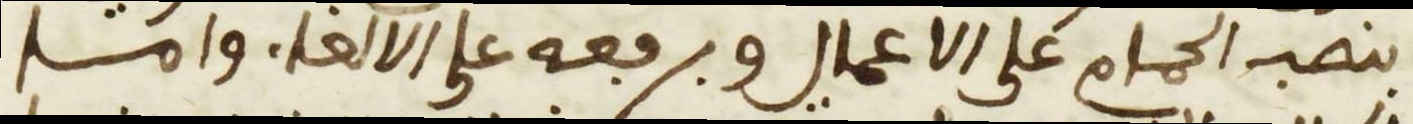بنصب الحمام على الاعمال و برفعه على الالغاء و اما
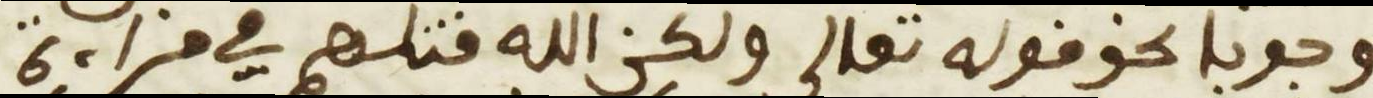وجوبا نحو قوله تعالى و لمن الله قتلهم في قراءة
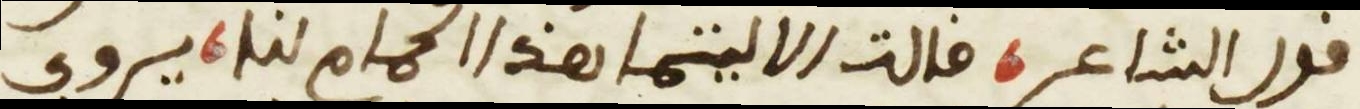قول الشاعر قالت الا ليتما هذا الحمام لنا يروي
